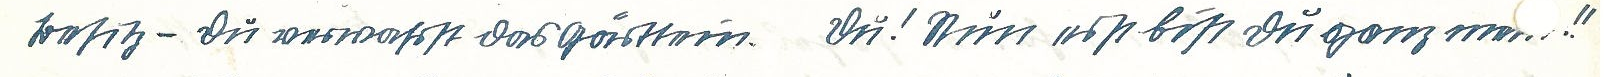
Besitz – Du!verwahrst das Gärtlein. Du! Nun erst bist Du ganz me!!
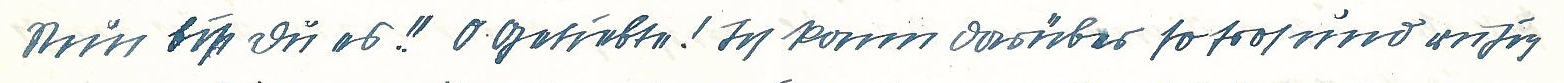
Nun bist Du es!! O Geliebte! Ich kann darüber so froh und ruhig
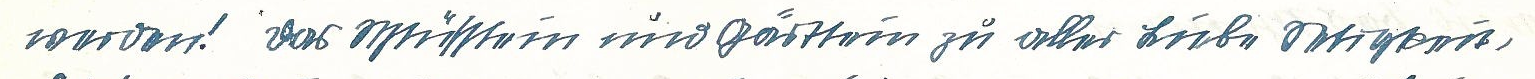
werden! Das Schlüsslein und Gärtlein zu aller Liebe Seligkeit,
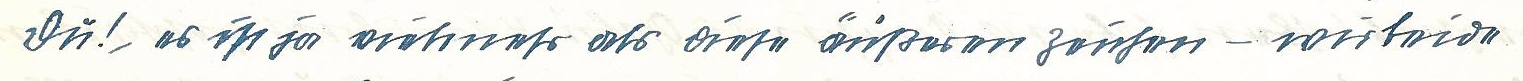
Du!, es ist ja vielmehr als diese äußeren Zeichen – wir beide
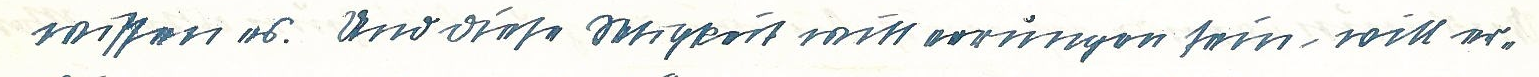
wissen es. Und diese Seligkeit will errungen sein, will er¬
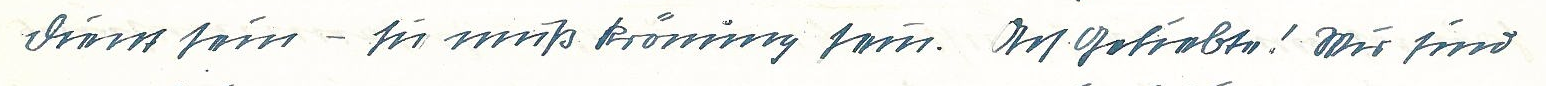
dient sein – sie muß Krönung sein. Ach Geliebte! Wir sind
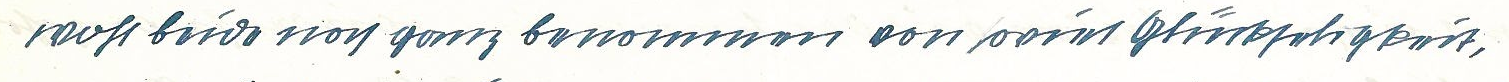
wohl beide noch ganz benommen von viel Glückseligkeit,
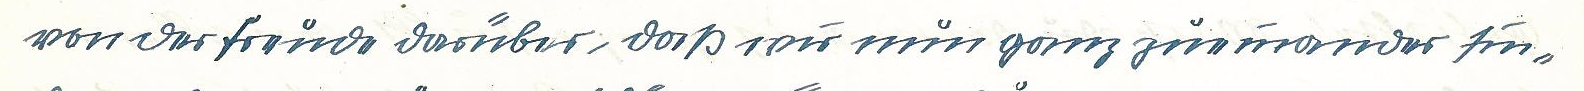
von der Freude darüber, daß wir nun ganz zueinander fin¬
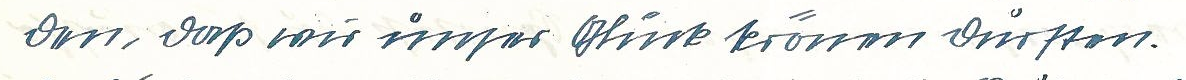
den, daß wir unser Glück krönen durften.
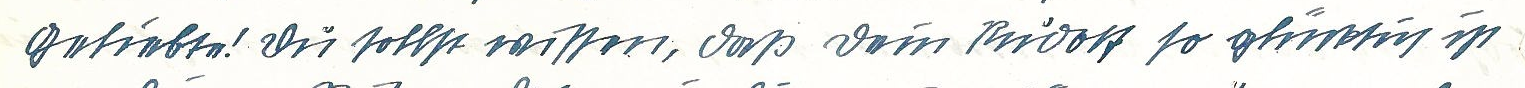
Geliebte! Du sollst wissen, daß Dein Rudolf so glücklich ist
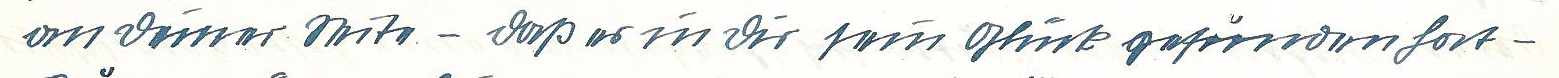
an Deiner Seite – daß er in Dir sein Glück gefunden hat –
